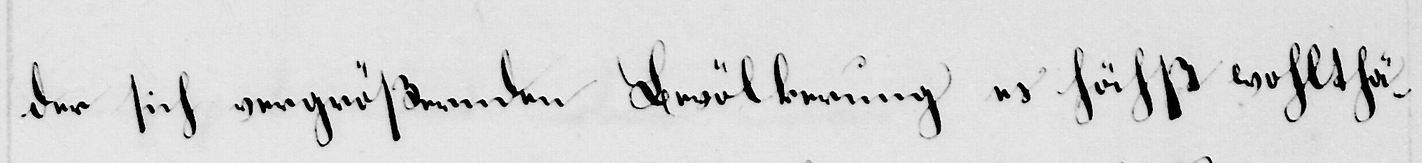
der sich vergrößernden Bevölkerung es höchst wohlthä¬
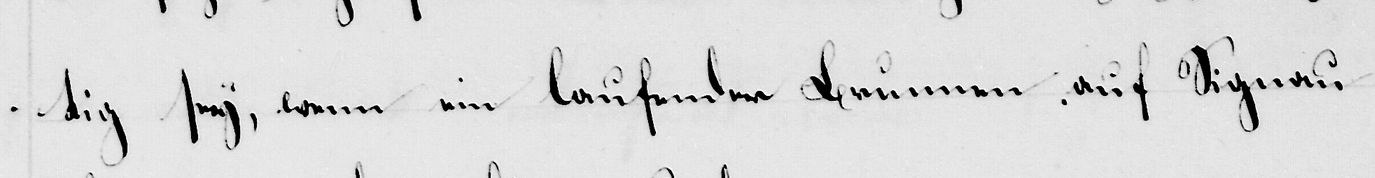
tig sey, wenn ein laufender Brunnen auf Signau
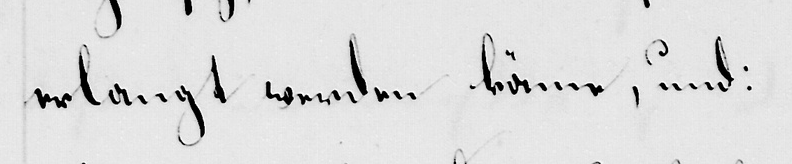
erlangt werden könne, und:
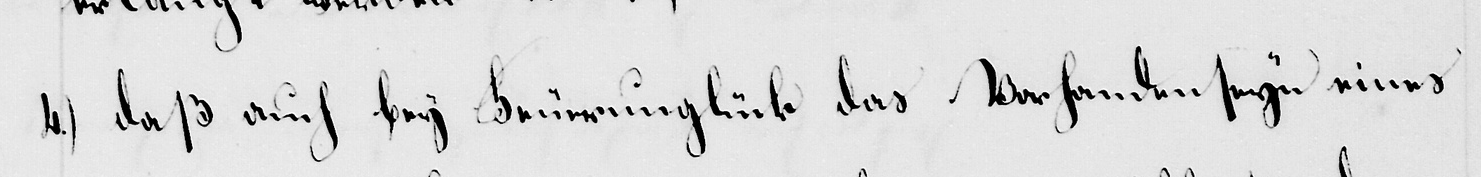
4.) daß auch bey Feuerunglück das Vorhandenseyn eines
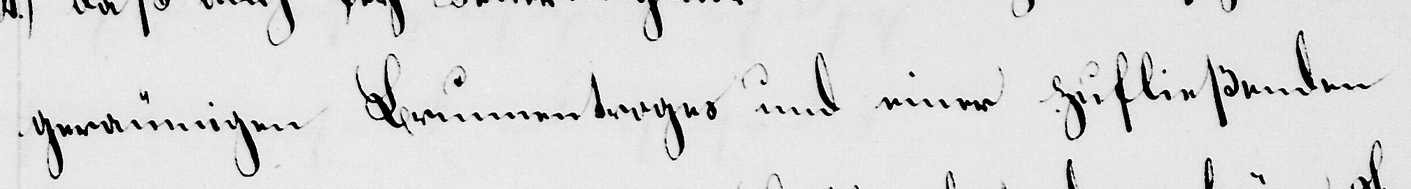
geräumigen Brunnentroges und einer zufließenden
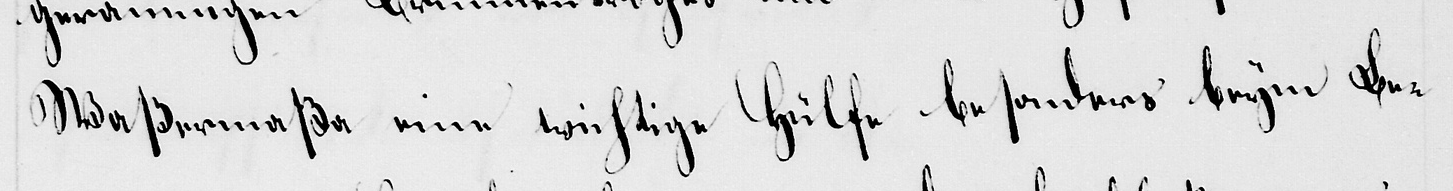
Waßermaße eine wichtige Hülfe besonders beym Be¬
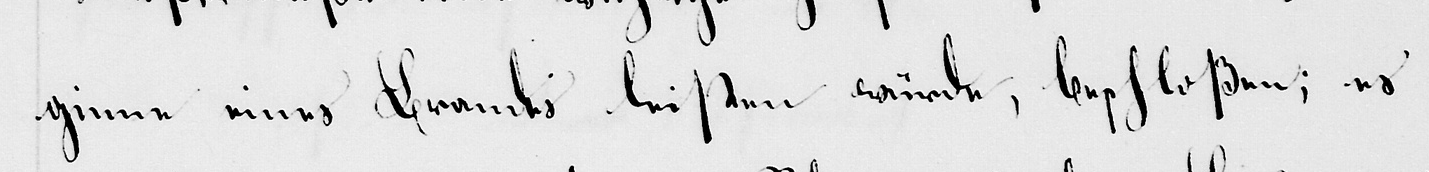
ginne eines Brands leisten würde, beschloßen; es
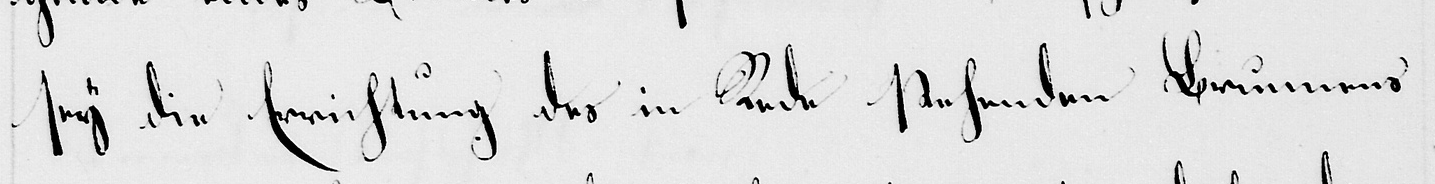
sey die Errichtung des in Rede stehenden Brunnens
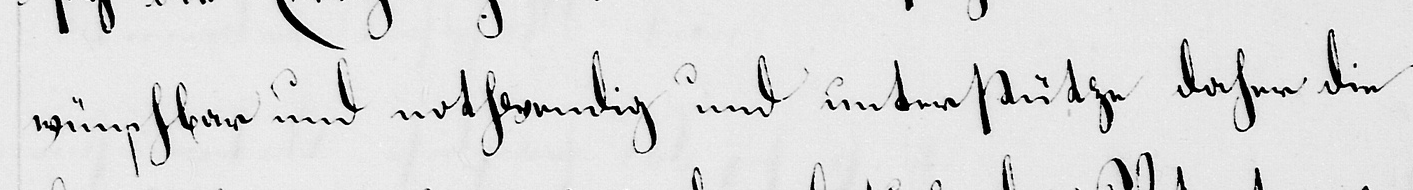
wünschbar und nothwendig und unterstütze daher die
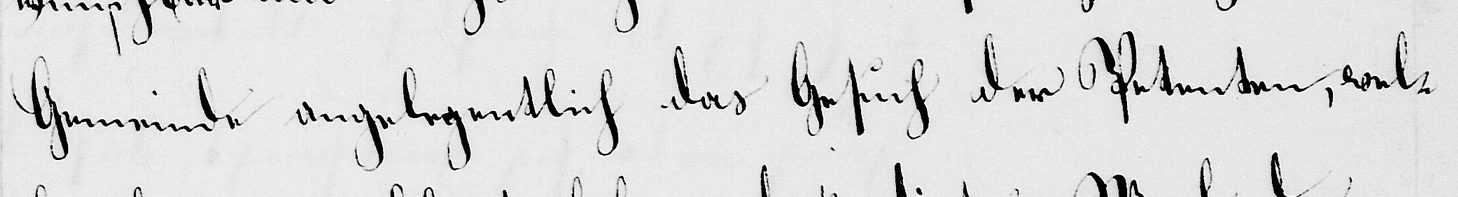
Gemeinde angelegentlich das Gesuch der Petenten, wel¬
